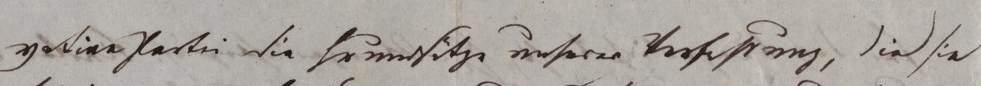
vative Partei die Grundsätze unserer Verfassung, die sie
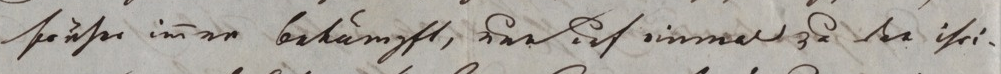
früher immer bekämpft, nun auf einmal zu den ihri-
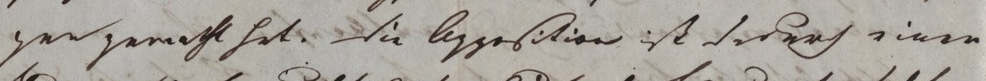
gen gemacht hat. Die Opposition ist dadurch einer
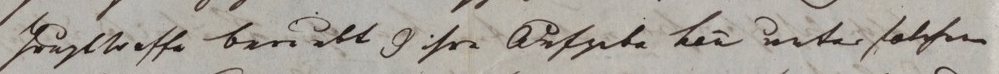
Hauptwaffe beraubt & ihre Aufgabe kann unter solchen
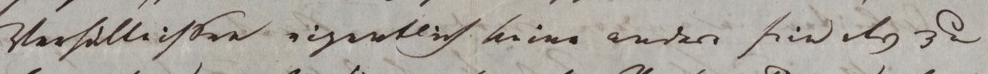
Verhältnissen eigentlich keine andere sein als zu
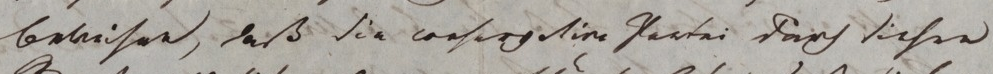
beweisen, daß die conservative Partei durch diesen
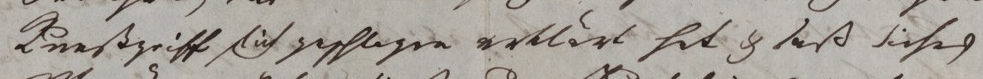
Kunstgriff sich geschlagen erklärt hat & daß dieses
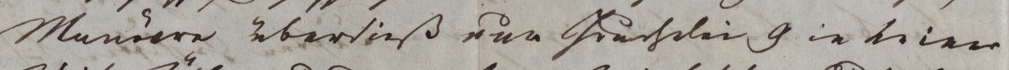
Manövrn überdieß nur Heuchelei & in keiner
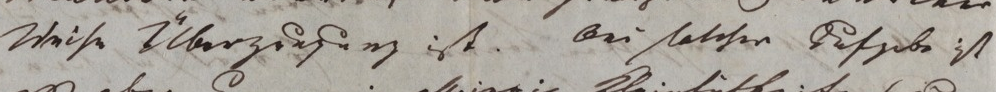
Weise Überzeugung ist. Bei solcher Aufgabe ist
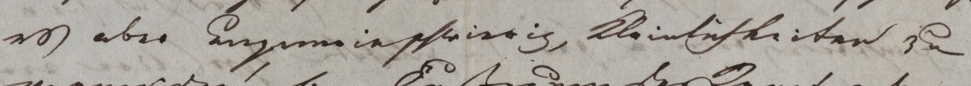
es aber ungemein schwierig, Kleinlichkeiten zu
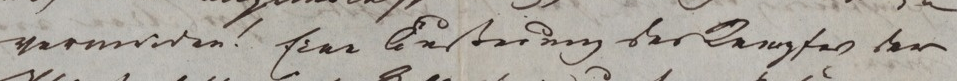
vermeiden! Eine Äußerung des Kampfes der
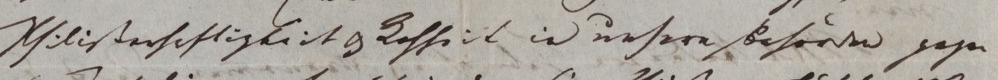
Philisterhaftigkeit & Rohheit in unsern Behörden gegen
